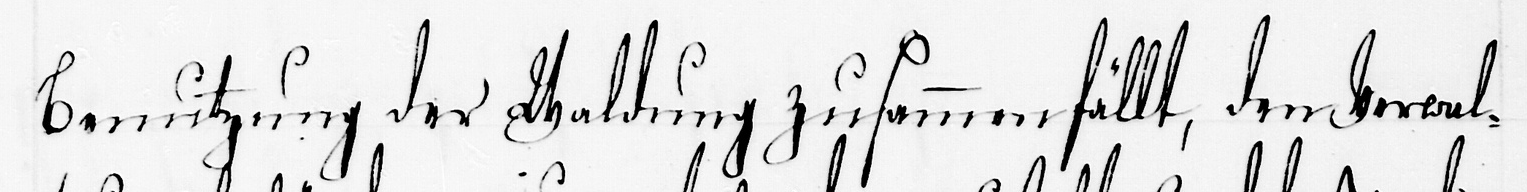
Benutzung der Waldung zusammenfällt, den Verwa¬
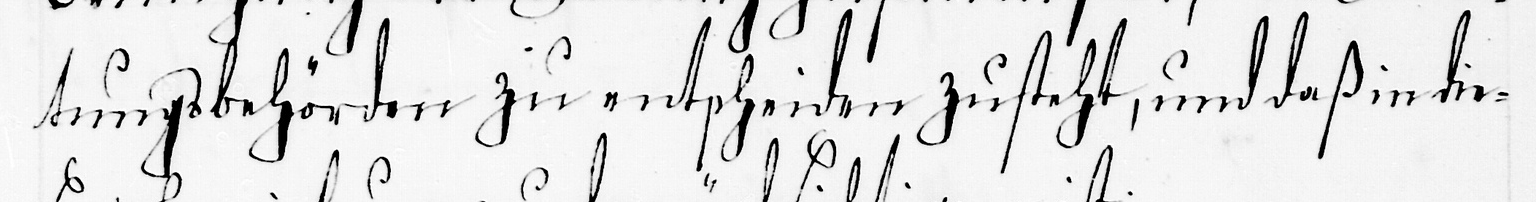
ltungsbehörden zu entscheiden zusteht, und daß in die¬
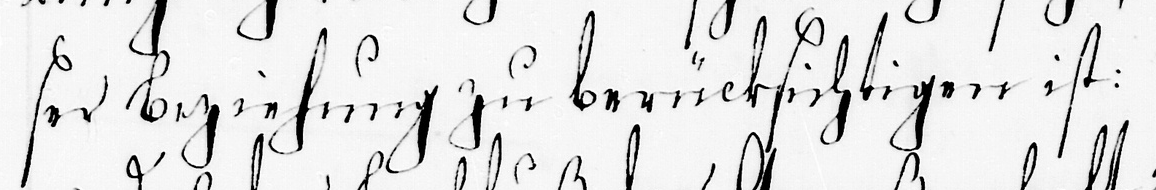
ser Beziehung zu berücksichtigen ist:
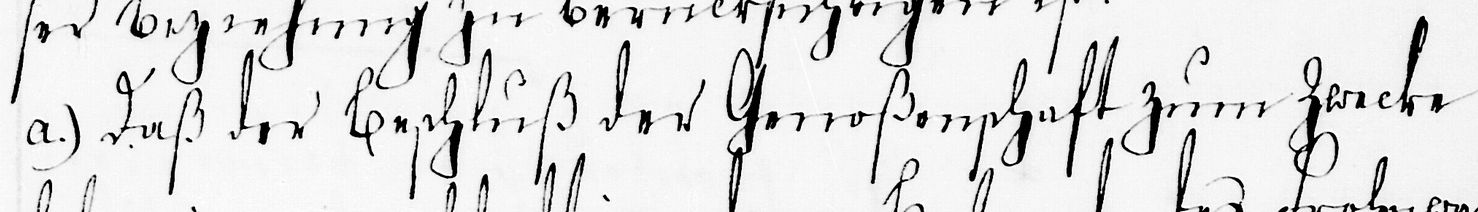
a.) Daß der Beschluß der Genoßenschaft zum Zwecke
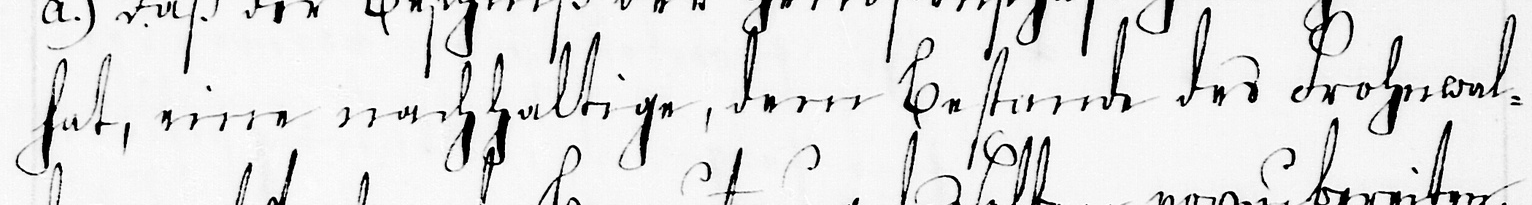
hat, eine nachhaltige, dem Bestande des Frohnwal¬
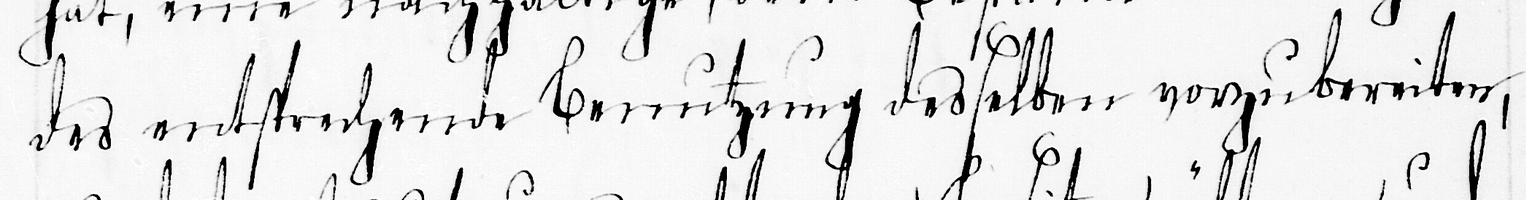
des entsprechende Benutzung desselben vorzubereiten,
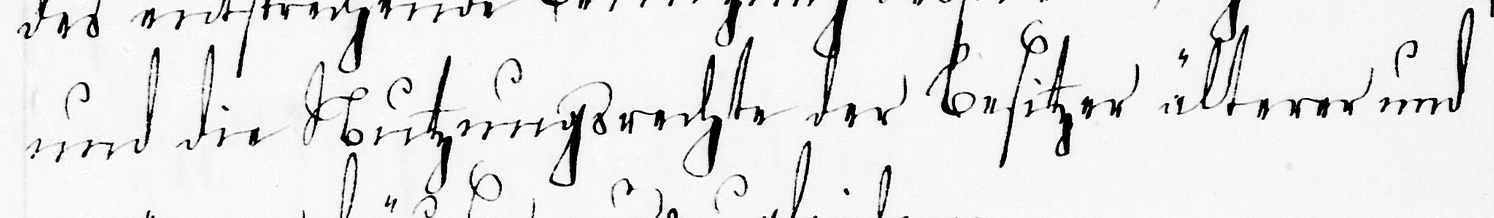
und die Nutzungsrechte der Besitzer älterer und
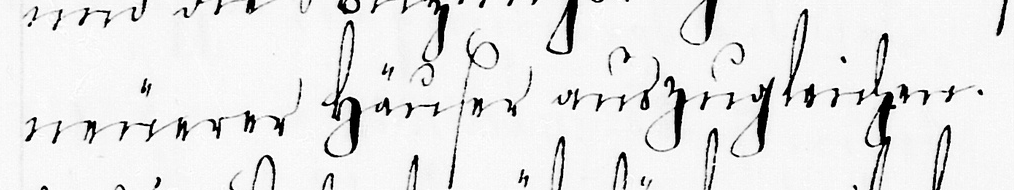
neuerer Häuser auszugleichen.
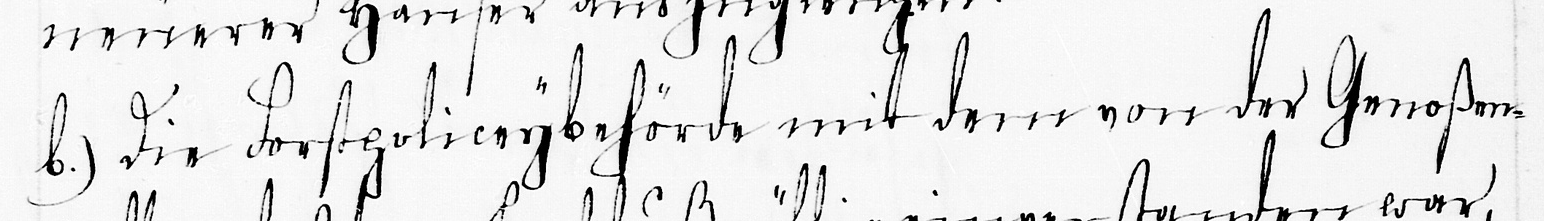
b.) Die Forstpoliceybehörde mit dem von der Genoßen¬
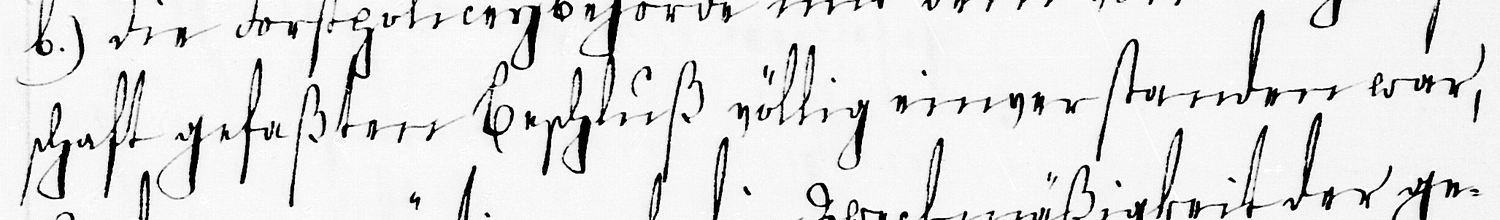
schaft gefaßten Beschluß völlig einverstanden war,
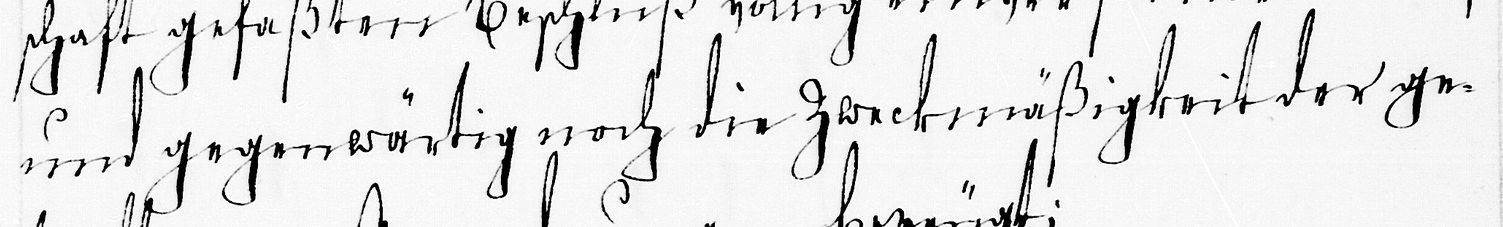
und gegenwärtig noch die Zweckmäßigkeit der ge¬
